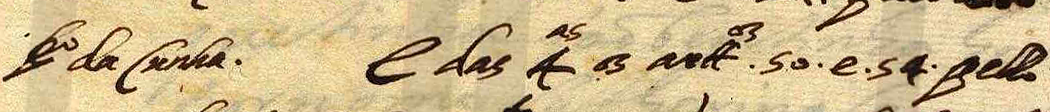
Po da Cunha. E das 4as os arttos. 50. e .54. pello
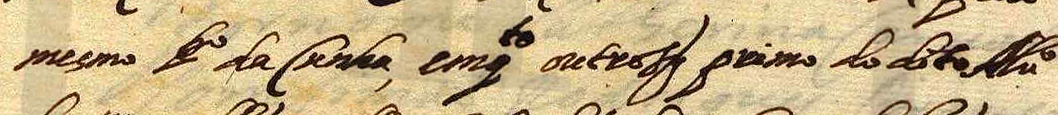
mesmo Po da Cunha, emqto outrosy primo do dito Aluo
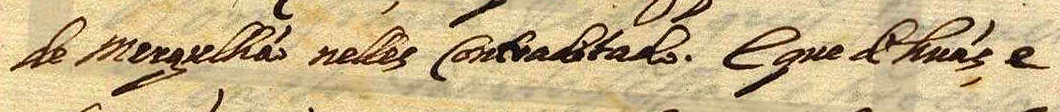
de mergulhaõ nelles Contraditado. E que d'huās, e
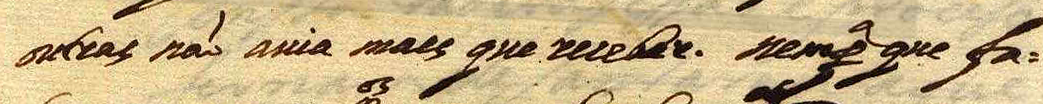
outras naõ auia maes que receber. nem pa que fa
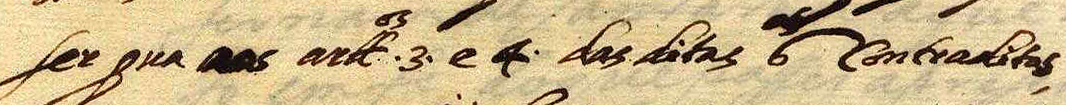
ser ꝓua aos arttos. 3. e 4. das ditas 6as contraditas,
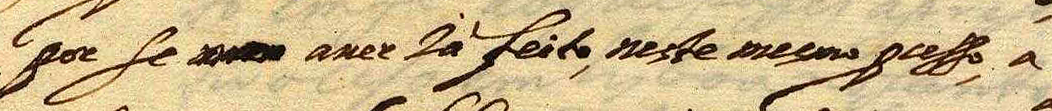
por se auer Iá feito, neste mesmo ꝓcesso, a
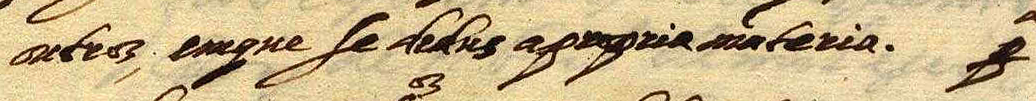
outros, em que se dedus a propria materia. ꝑa
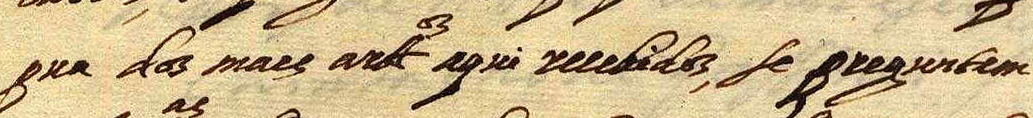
ꝓua dos maes arttos aqui recebidos, se preguntem
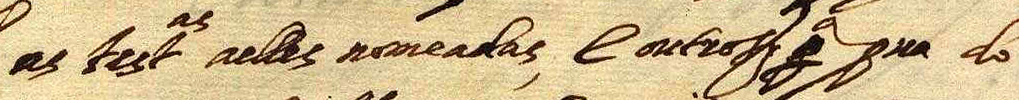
as testas a elles nomeadas, e outrosy ꝑa ꝓua do
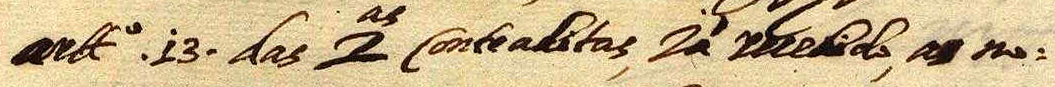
artto. i3. das 2as Contraditas, Iá recebido, as no
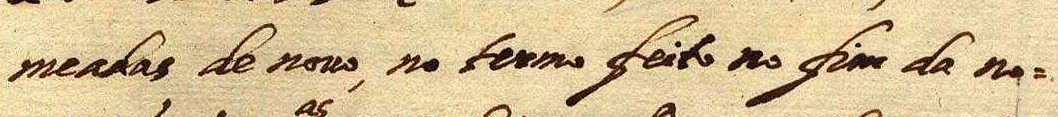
meadas de nouo, no termo feito no fim da no
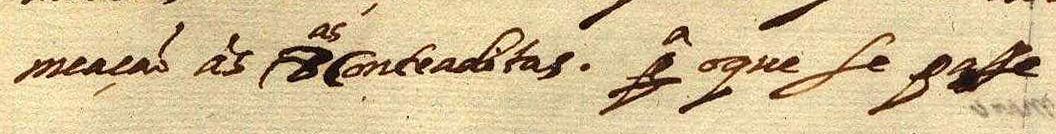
meaçaõ as 8as contraditas. ꝑa o que se passe
